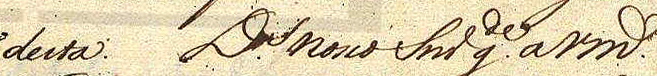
desta. D.s nosso Snr̄ g.de a v m.e
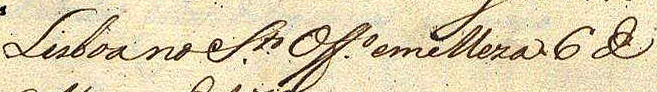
Lisboa no S.to Off.o em Meza 6 d̄
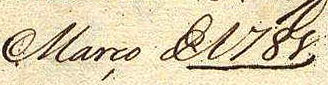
Março d̄ 1781
